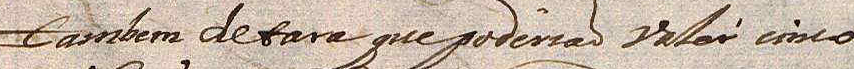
tambem de tara que poderiaõ valer cinco
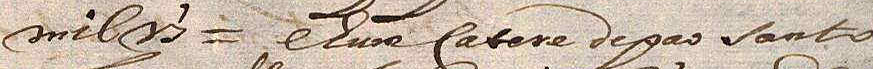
mil rs̄ = e hum Catere de pao santo
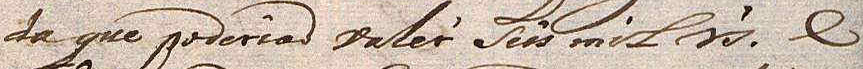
da que poderiaõ valer seis miL rs̄. E
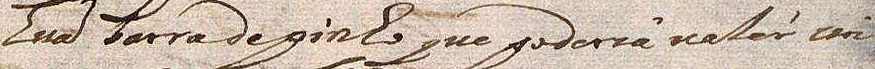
huā barra de pinho que poderia ualer cin
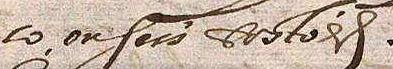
co, ou seis tostoes.
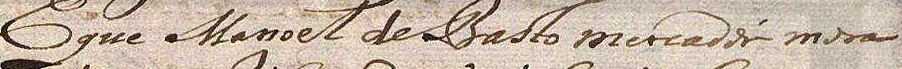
E que Manoel de Basto mercador mora
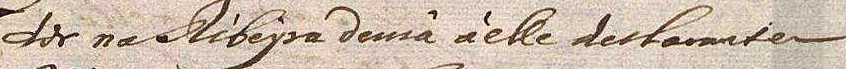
dor na Ribeyra deuia à elle declarante
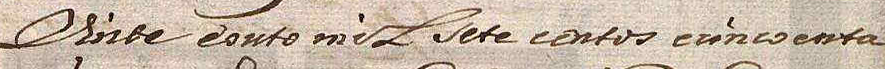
Vinte e outo miL setecentos e cincoenta
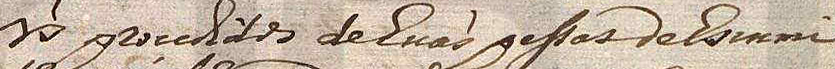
rs̄ proçedidos de huas̄ pessas de Escumi
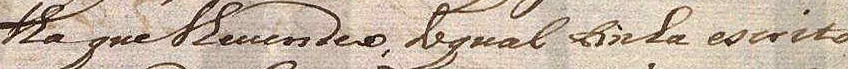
lha que lheuendeo, do qual tinha escrito
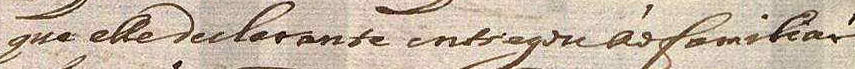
que elle declarante entregou áo familiar
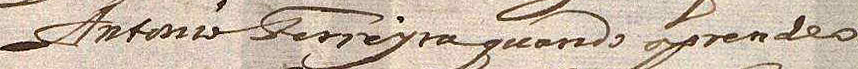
Antonio Ferreyra quando o prendeo
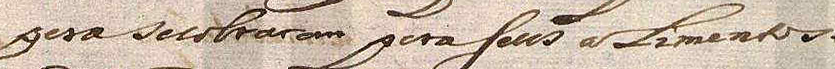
pera se cobrarem pera seus aLimentos.
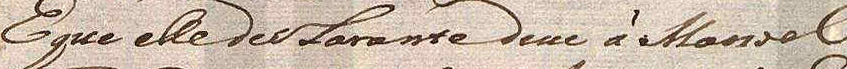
E que elle declarante deue à Manoel
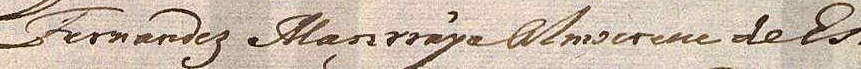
Fernandez Manrraya Almocreue de Es
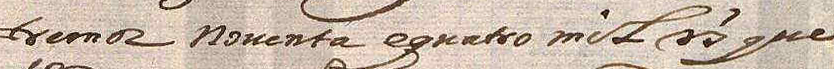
tremoz nouenta e quatro miL rs̄ que
